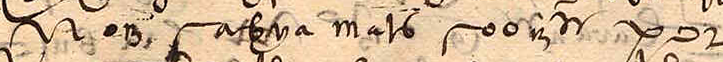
Nom sabya majs soomte por
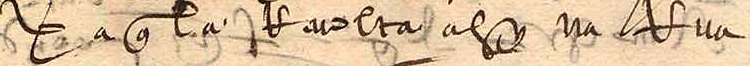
Ꝟ aq̄la Reuolta ahy na Rua
